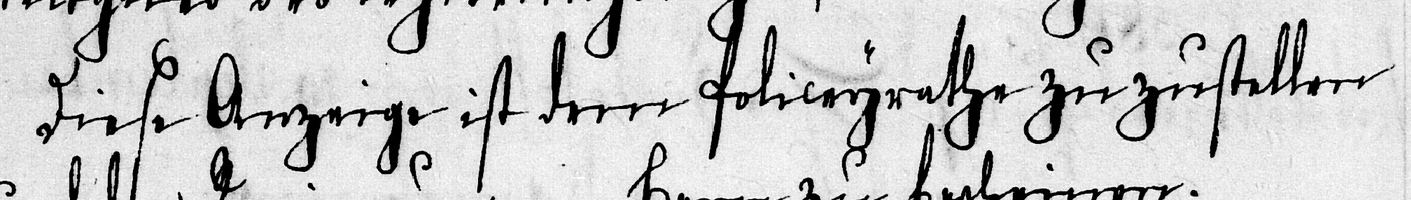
Diese Anzeige ist dem Policeyrathe zuzustellen
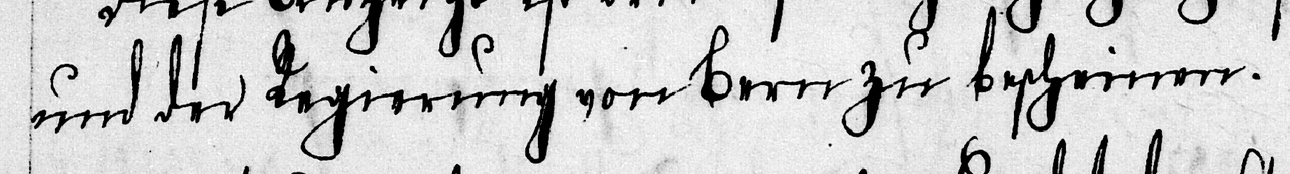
und der Regierung von Bern zu bescheinen.
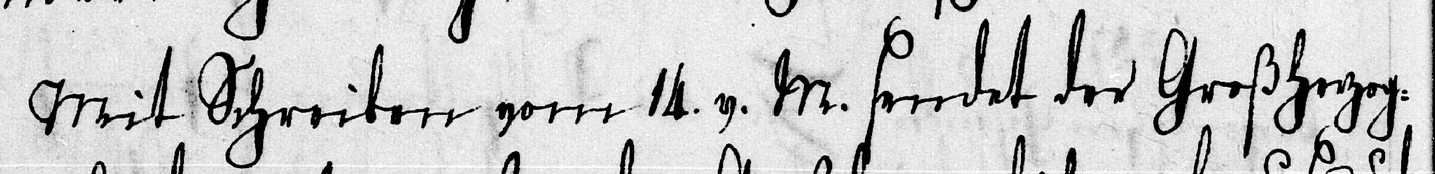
Mit Schreiben vom 14. v. M. sendet der Großherzog¬
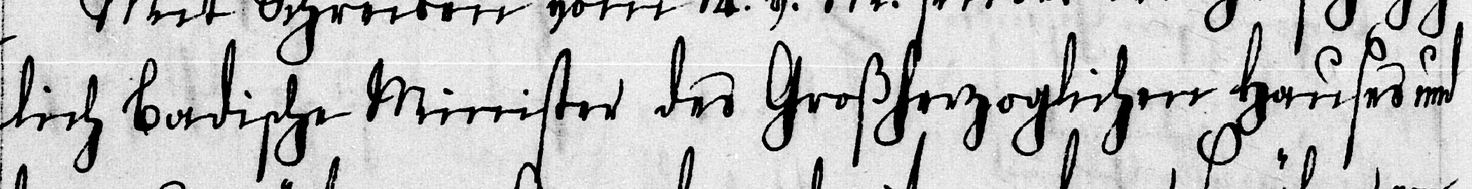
lich Badische Minister des Großherzoglichen Hauses
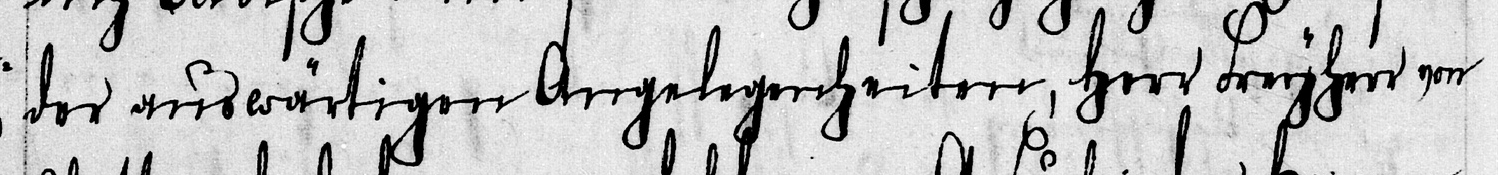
der auswärtigen Angelegenheiten, Herr Freyherr von
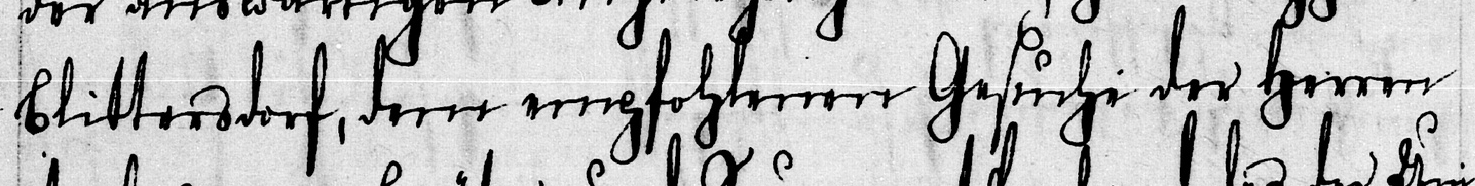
Blittersdorf, dem empfohlenen Gesuche der Herren
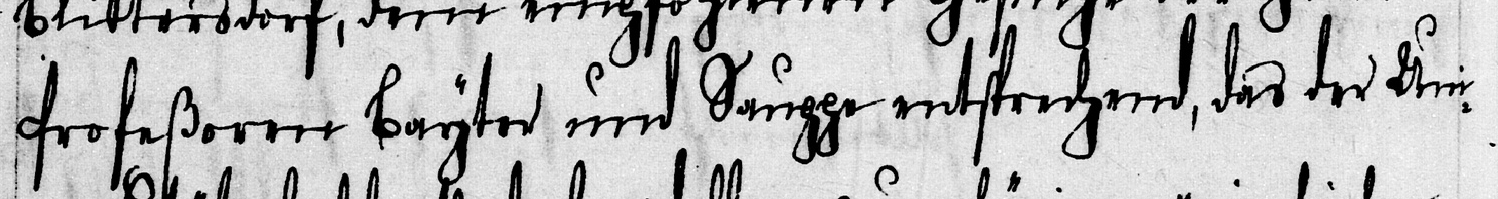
Profeßoren Bayter und Sauppe entsprechend, das der Uni¬
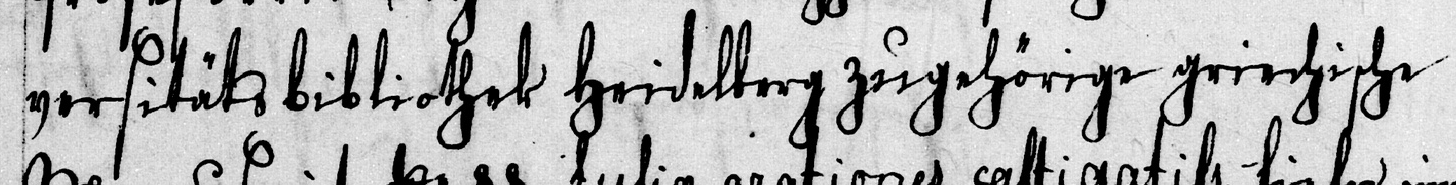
versitätsbibliothek Heidelberg zugehörige griechische
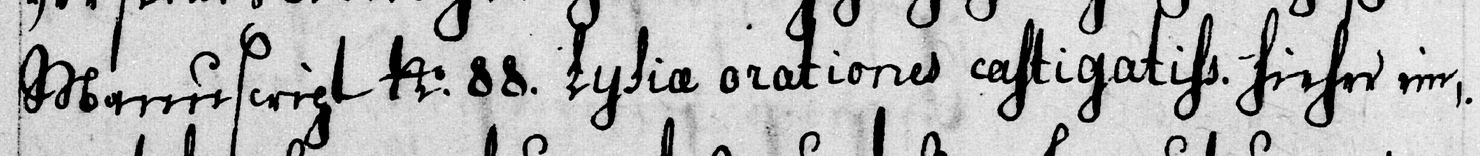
Manuscript No. 88. Lydia orationes castigatiss. hieher ein,
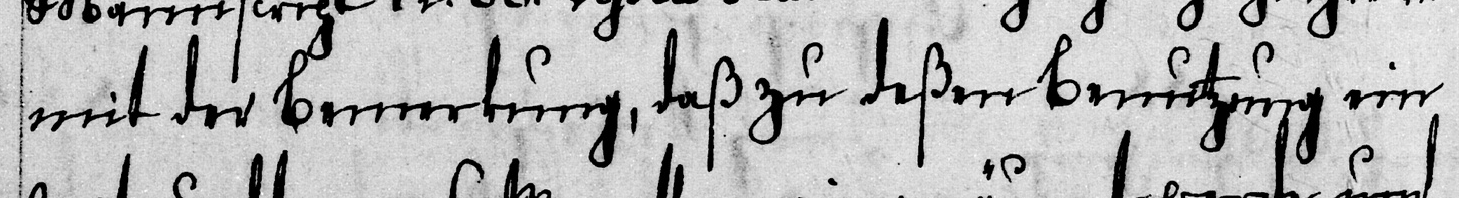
mit der Bemerkung, daß zu deßen Benutzung ein
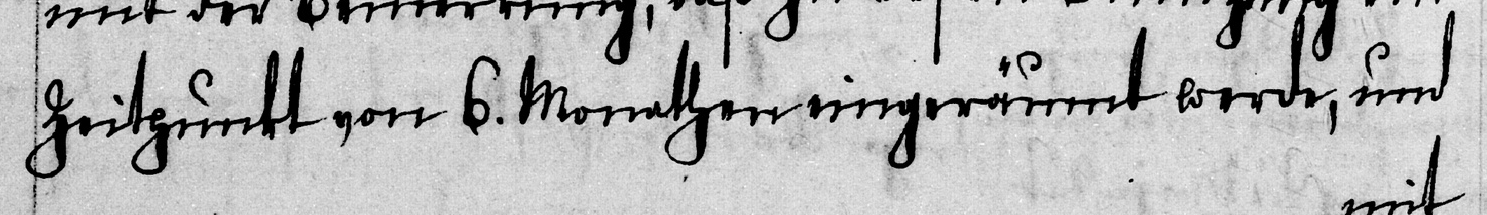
Zeitpunkt von 6. Monathen eingeräumt werde, und
